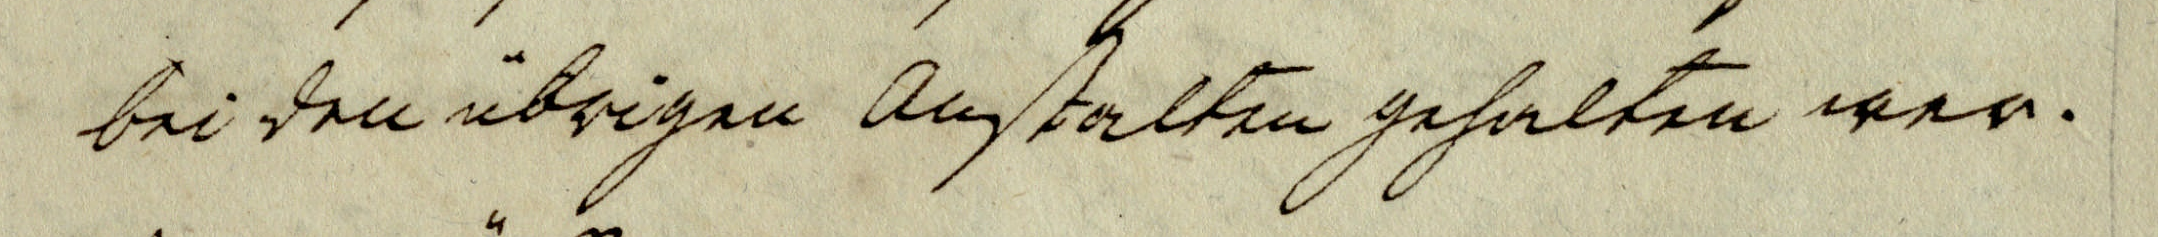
bei den übrigen Anstalten gehalten wer-
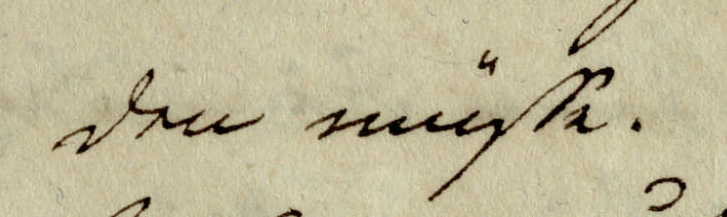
den müsse.
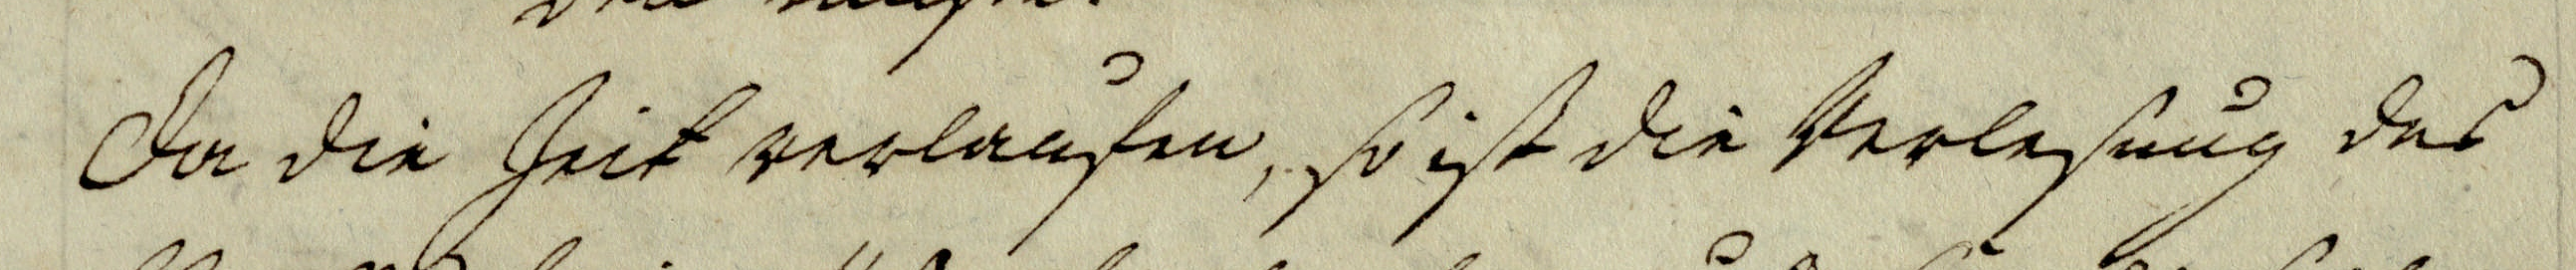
Da die Zeit verlaufen, so ist die Verlesung des
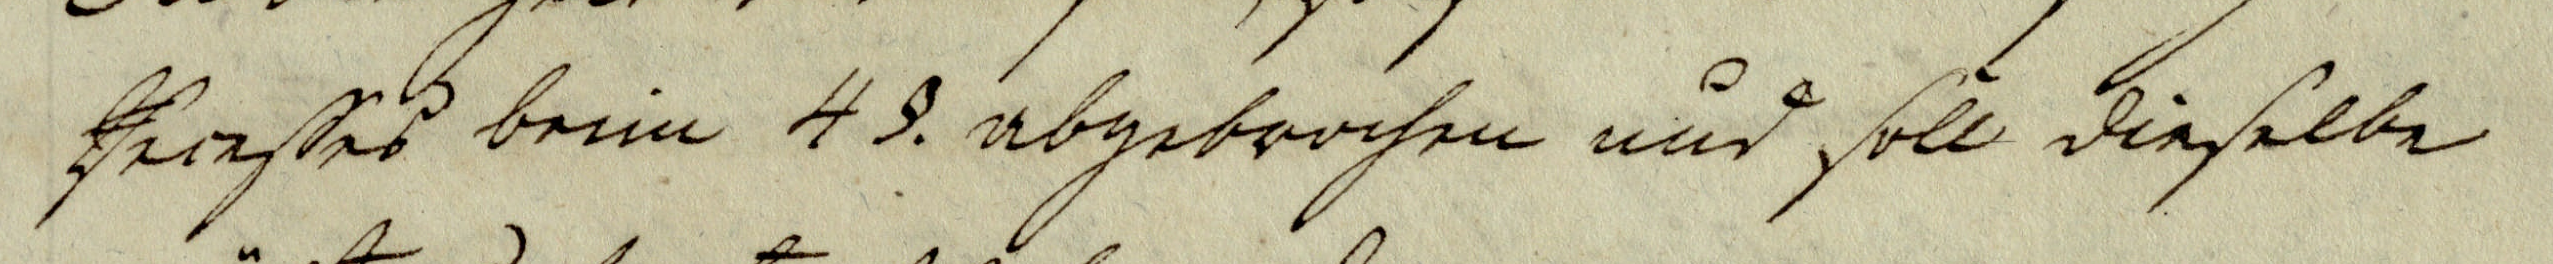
Recesses beim 4. §. abgebrochen und soll dieselbe
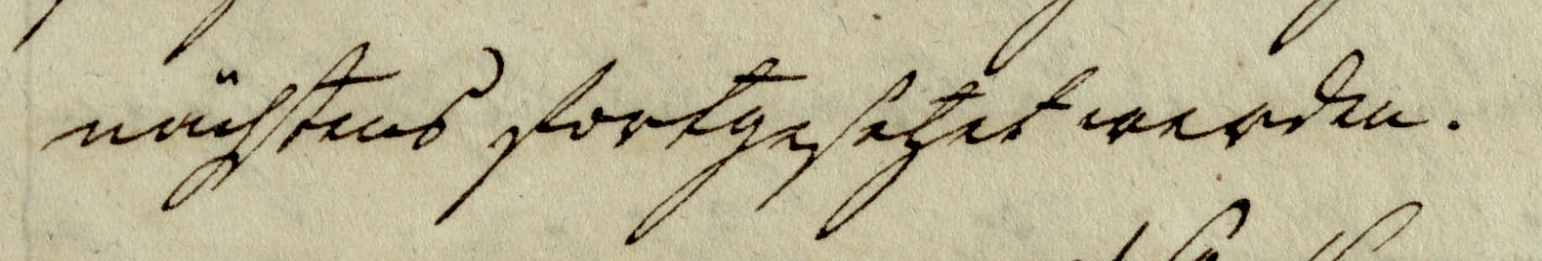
nächstens fortgesetzt werden.
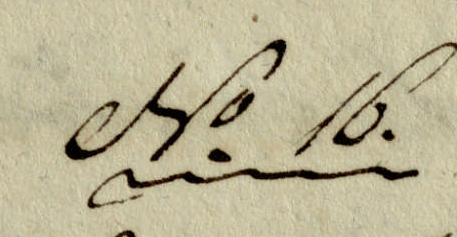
No 16.
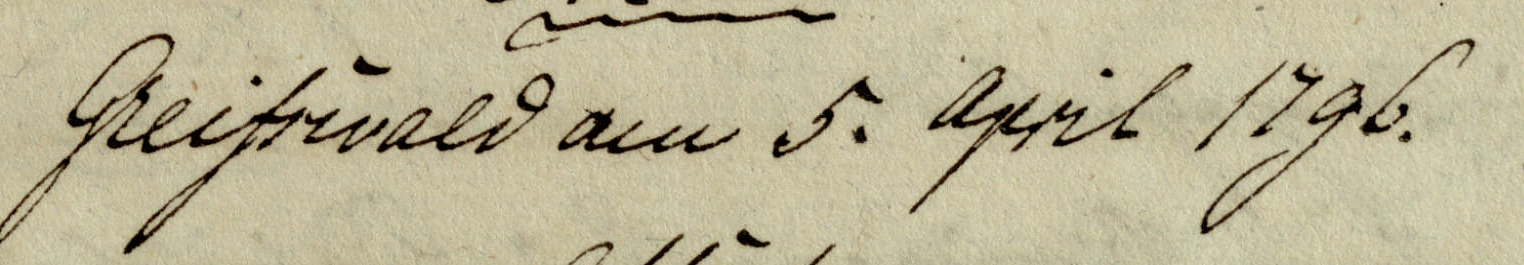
Greifswald am 5. April 1796.
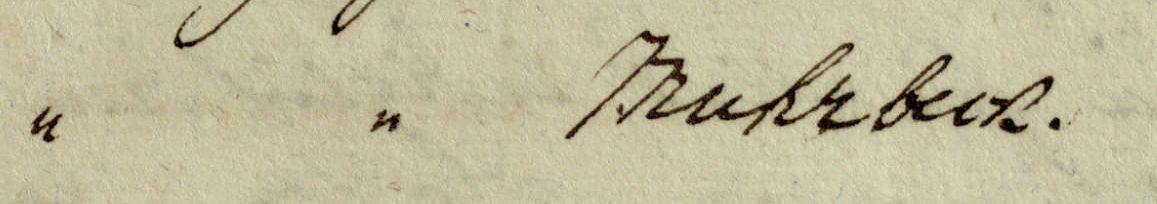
Muhrbeck.
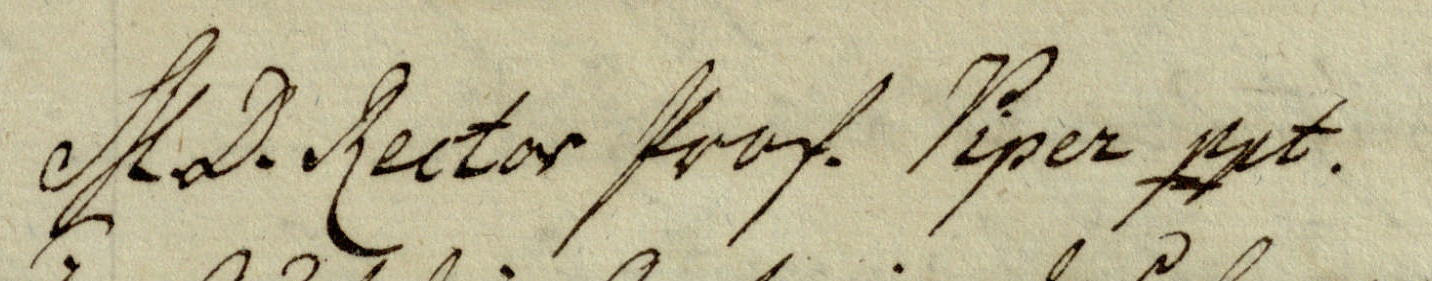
M. D. Rector Prof. Piper ppt.
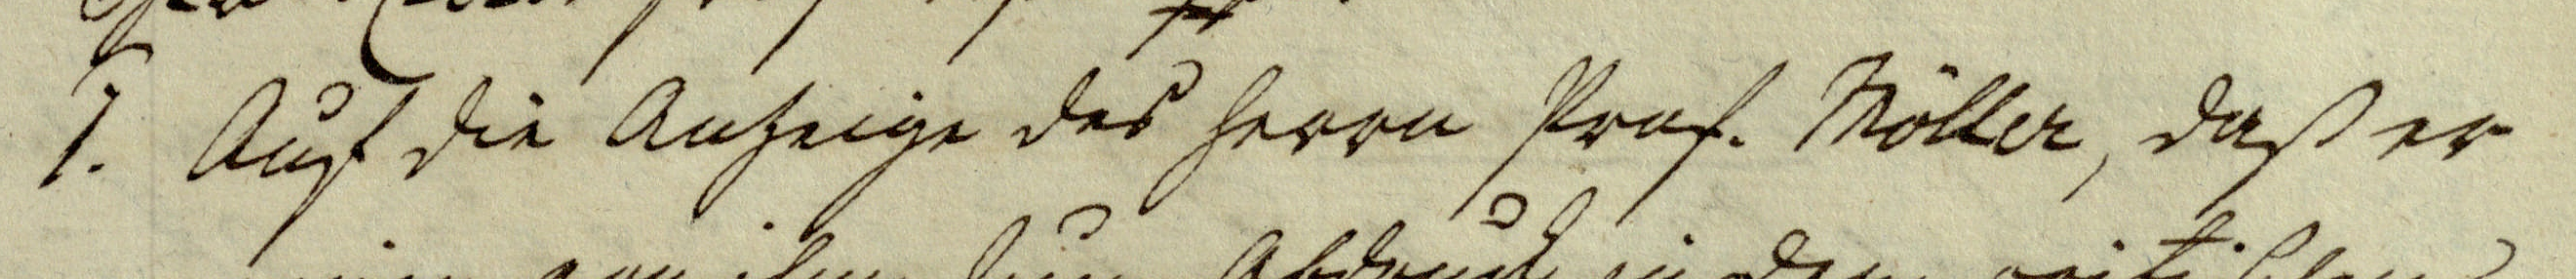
1. Auf die Anzeige des Herrn Prof. Möller, daß er
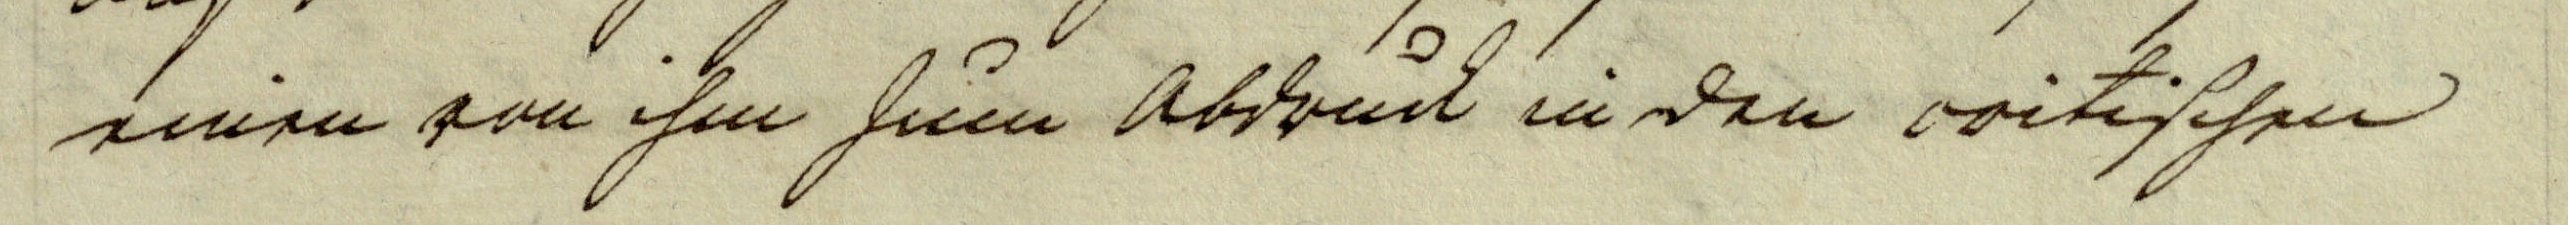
einen von ihm zum Abdruck in den critischen
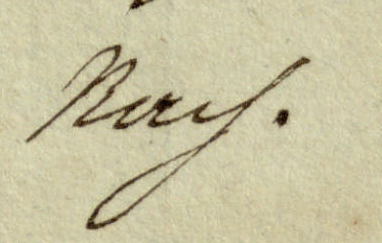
Nach¬
